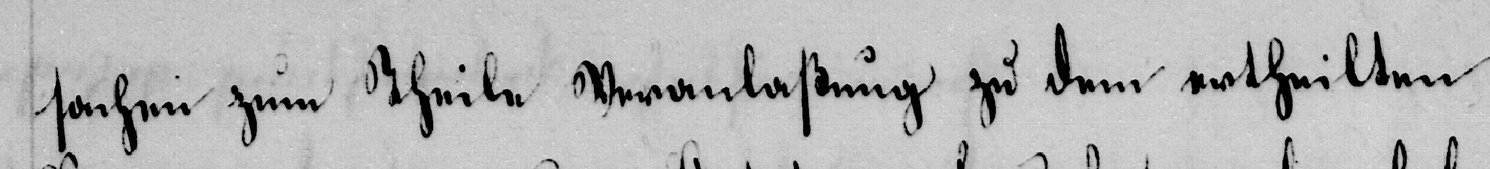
sachen zum Theile Veranlaßung zu dem ertheilten
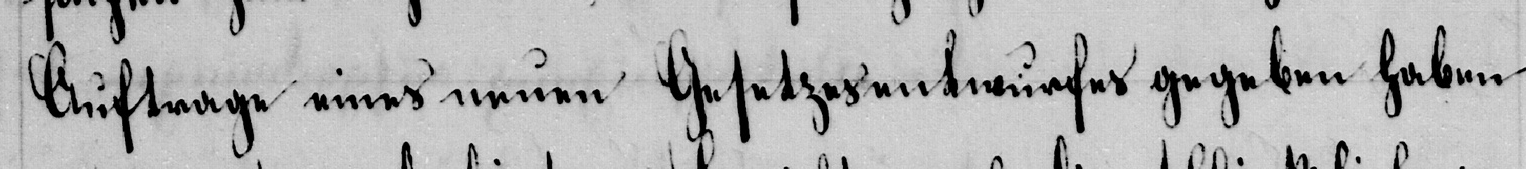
Auftrage eines neuen Gesetzesentwurfes gegeben haben
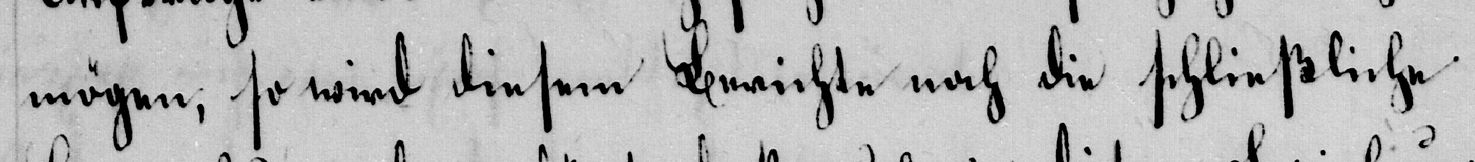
mögen, so wird diesem Berichte noch die schließliche
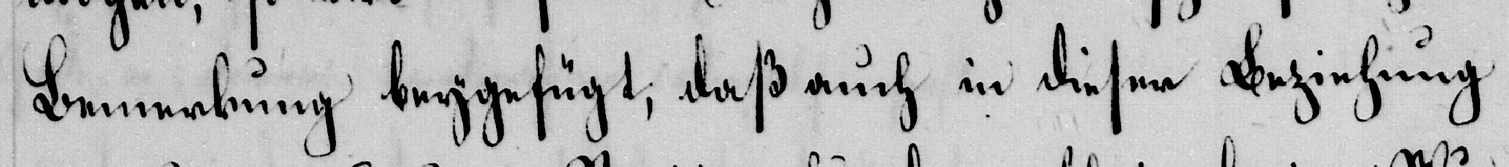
Bemerkung beygefügt, daß auch in dieser Beziehung
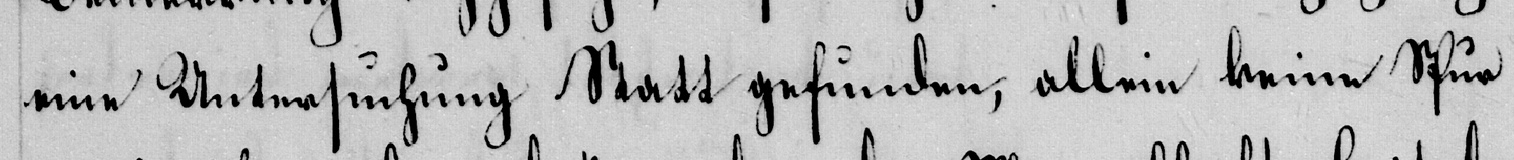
eine Untersuchung Statt gefunden, allein keine Spur
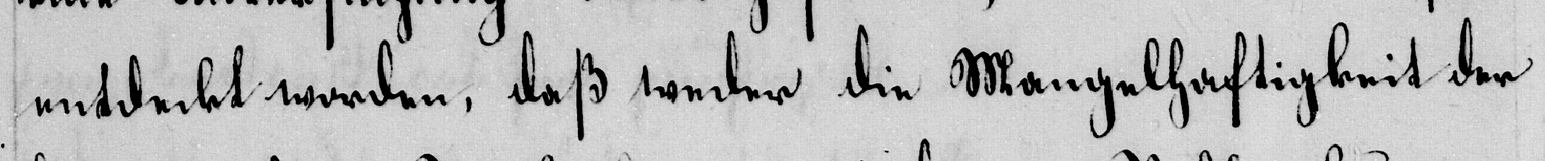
entdeckt worden, daß weder die Mangelhaftigkeit der
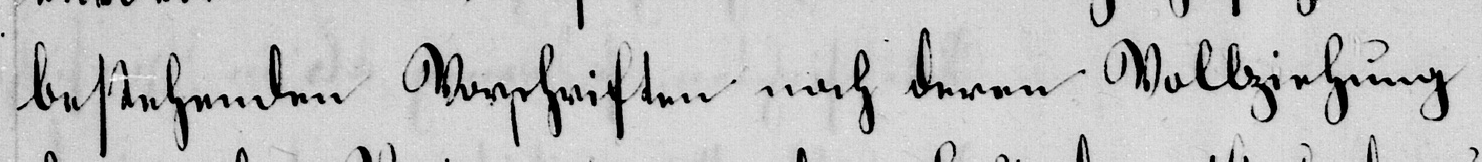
bestehenden Vorschriften noch deren Vollziehung
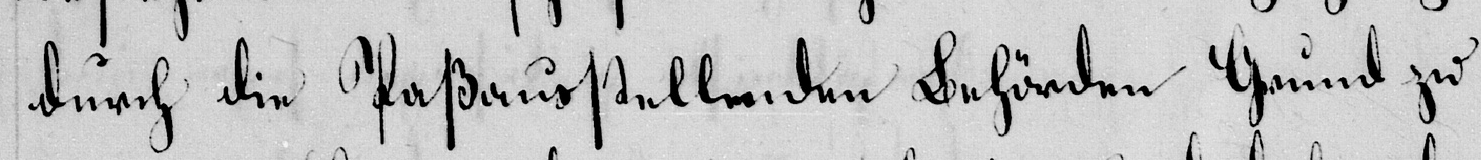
durch die Paßausstellenden Behörden Grund zu
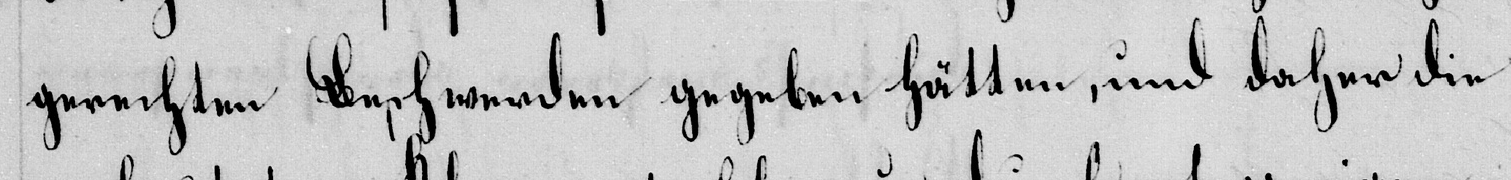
gerechten Beschwerden gegeben hätten, und daher die
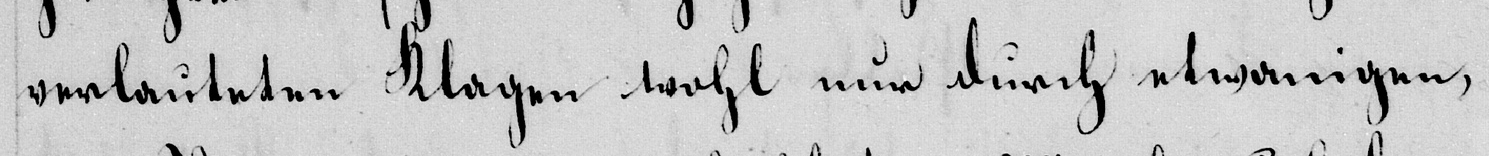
verlauteten Klagen wohl nur durch etwanigen,
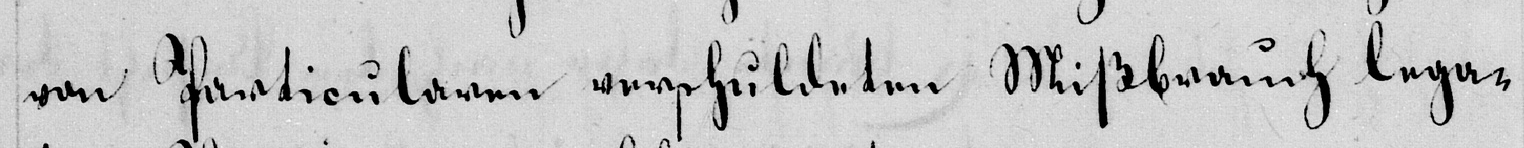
von Particularen verschuldeten Mißbrauch lega¬
